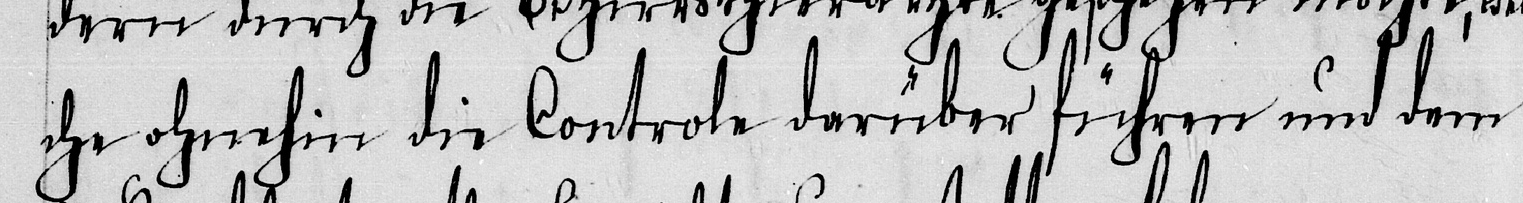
lche ohnehin die Controle darüber führen und dem
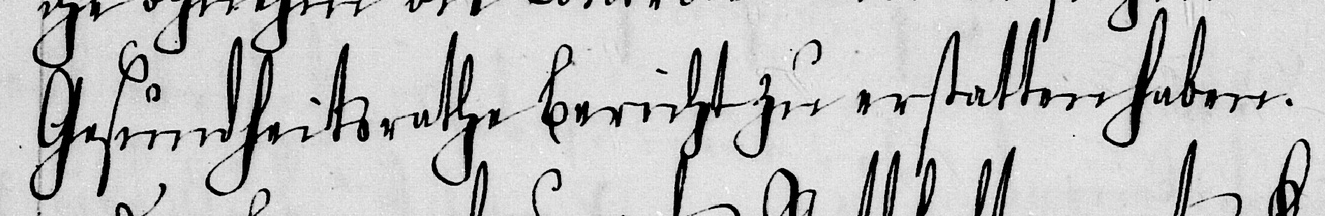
Gesundheitsrathe Bericht zu erstatten haben.
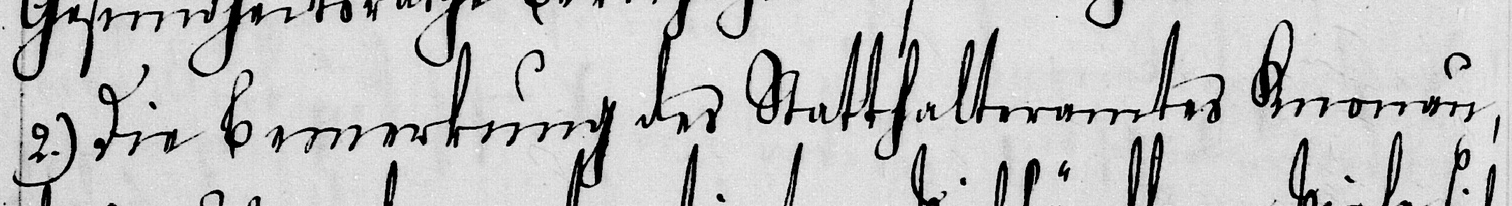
2.) Die Bemerkung des Statthalteramtes Knonau,
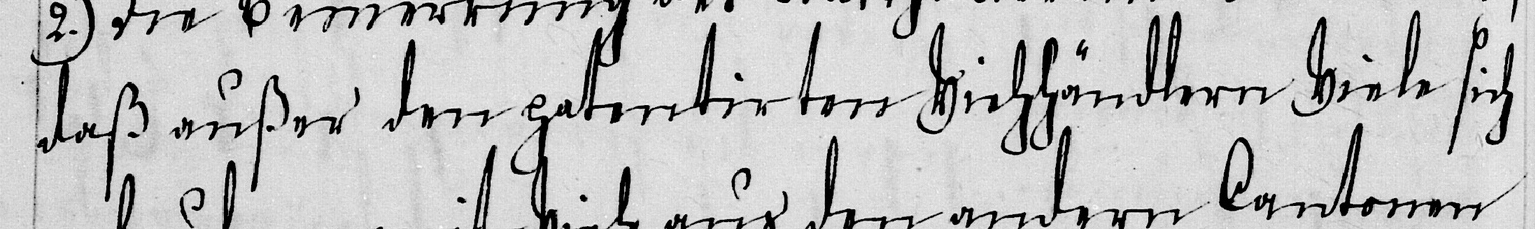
daß außer den patentirten Viehhändlern Viele sich
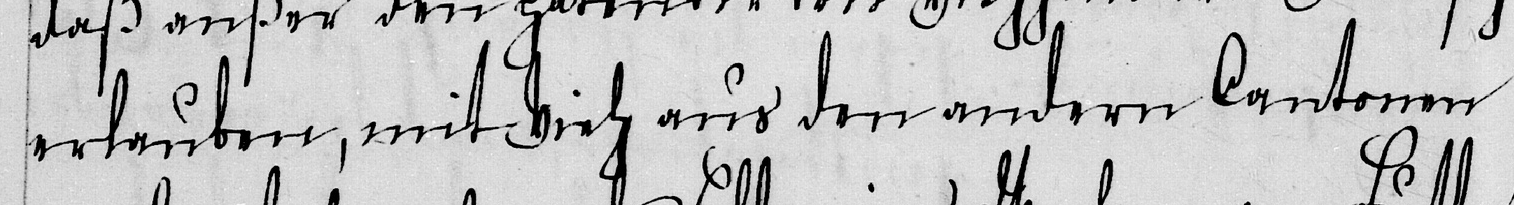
erlauben, mit Vieh aus den andern Cantonen
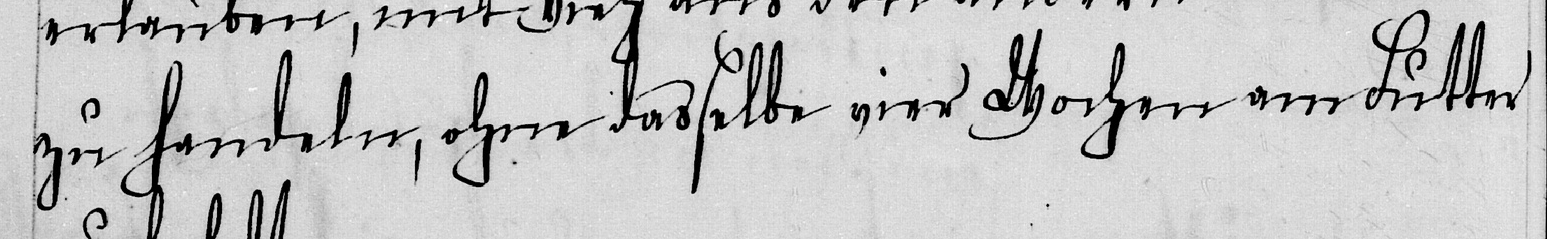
zu handeln, ohne dasselbe vier Wochen am Futter
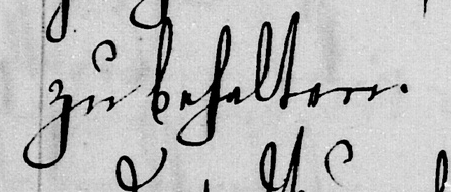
zu behalten.
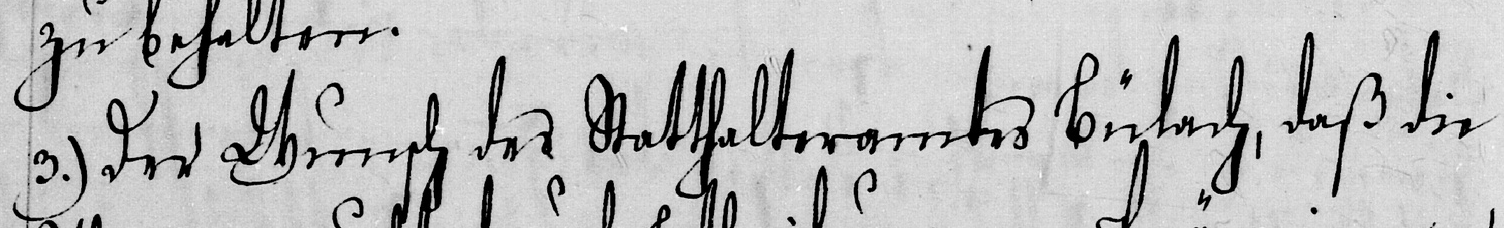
3.) Der Wunsch des Statthalteramtes Bülach, daß die
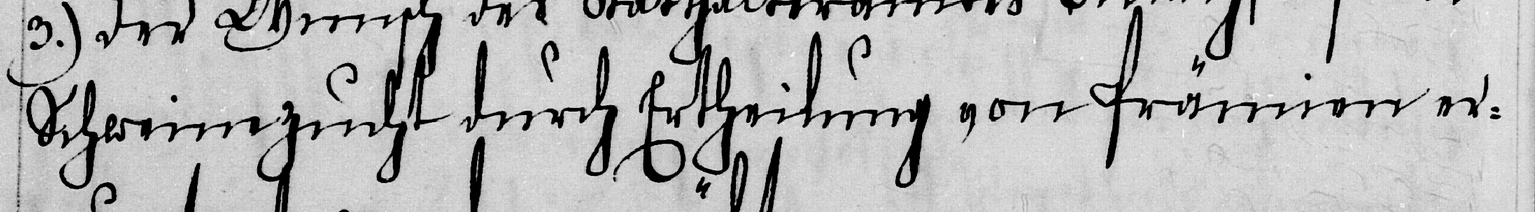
Schweinezucht durch Ertheilung von Prämien er¬
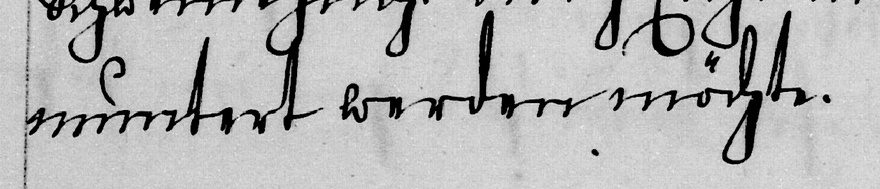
muntert werden möchte.
